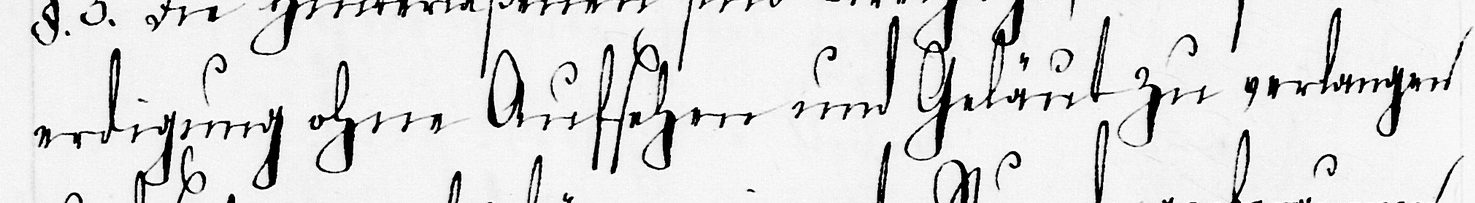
erdigung ohne Aufsehen und Geläut zu verlangen
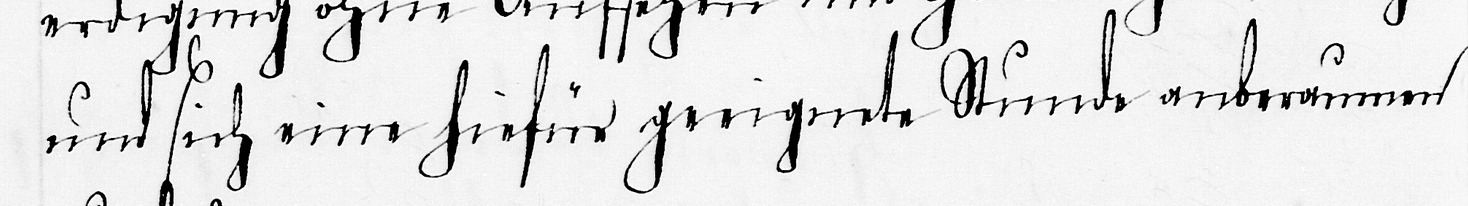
und sich eine hiefür geeignete Stunde anberaumen
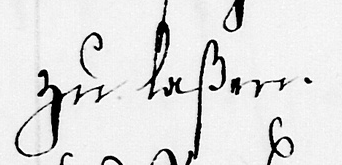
zu laßen.
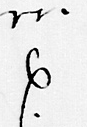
§.
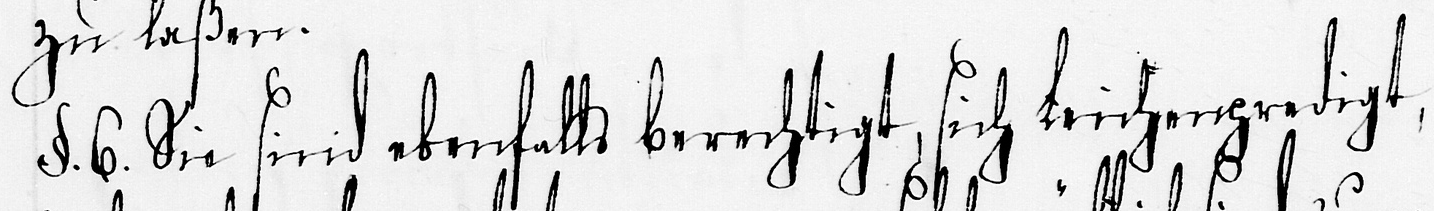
6. Sie sind ebenfalls berechtigt, sich Leichenpredig¬
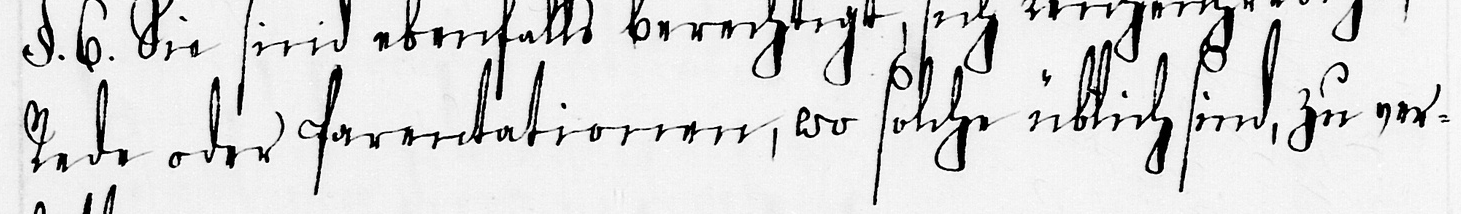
Rede oder Parentationen, wo solche üblich sind, zu ve¬
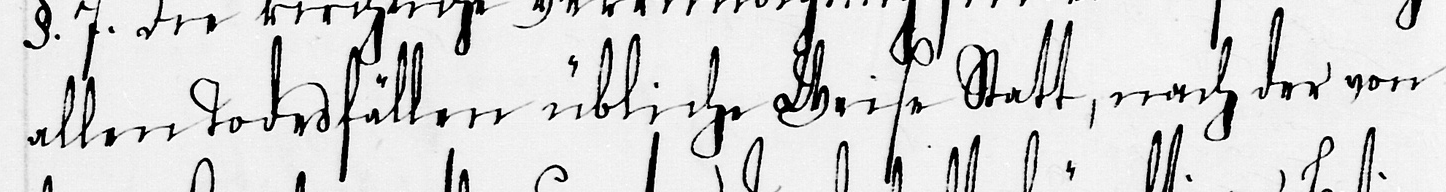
allen Todesfällen übliche Weise Statt, nach der von
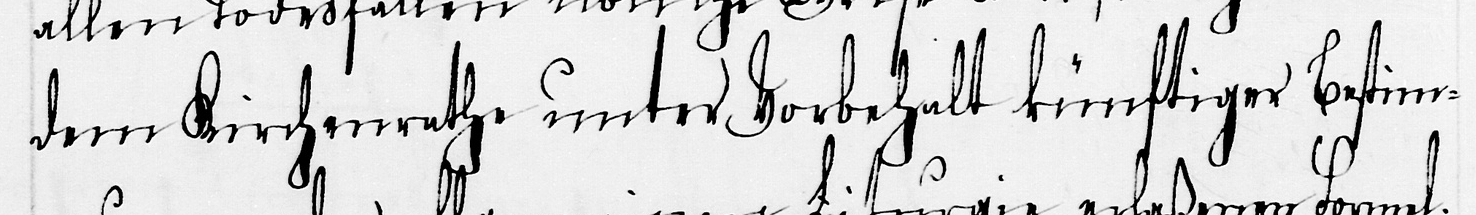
dem Kirchenrathe unter Vorbehalt künftiger Bestim¬
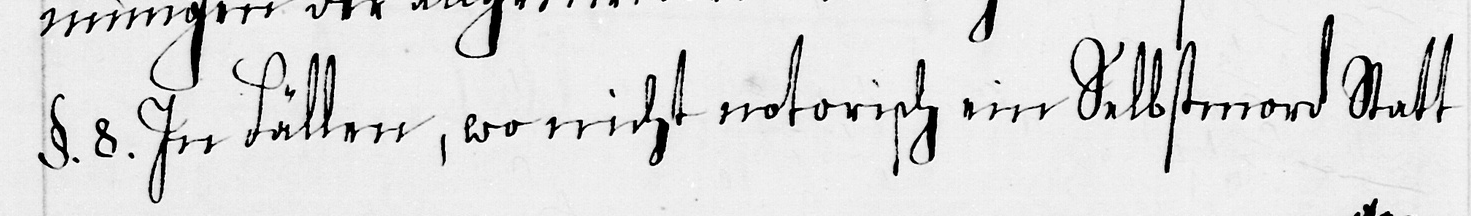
§. 8. In Fällen, wo nicht notorisch ein Selbstmord Statt
